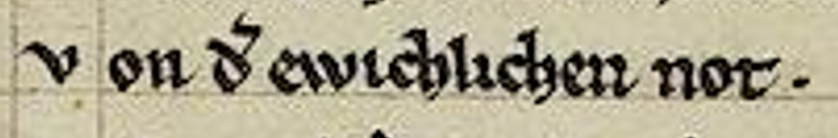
Von d(er) ewichlichen not.
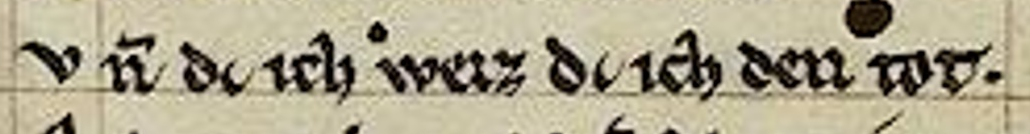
Vn(d) d(az) ich weiz d(az) ich den tot.
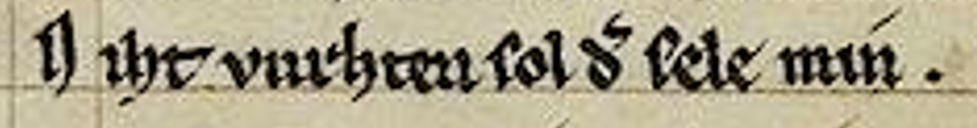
Niht vurhten ſol d(er) ſele min.
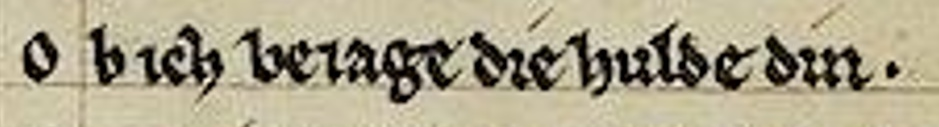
Ob ich beiage die hulde din.
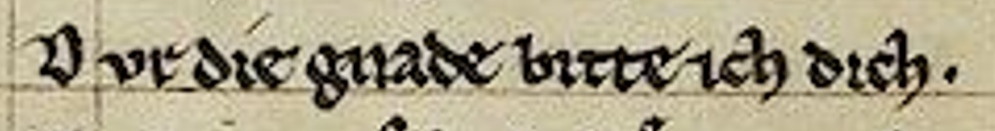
Dvr die gnade bitte ich dich.
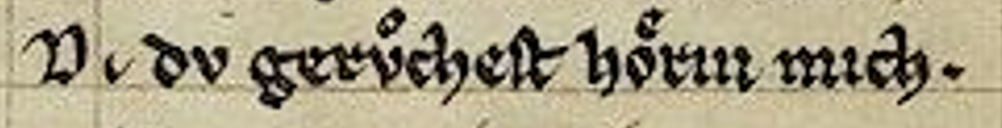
D(az) dv gerv°ocheſt ho°erin mich.
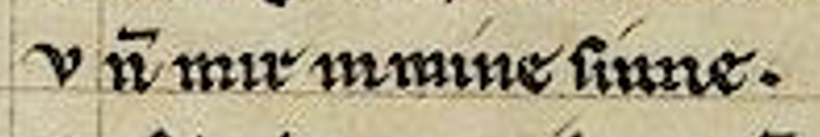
Vn(d) mir in mine ſinne.
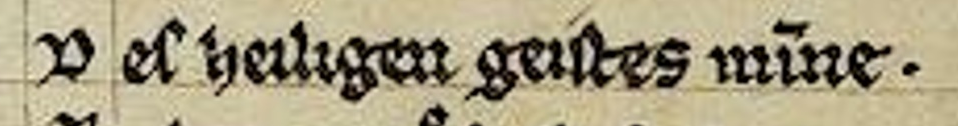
Deſ heiligen geiſtes mi(n)ne.
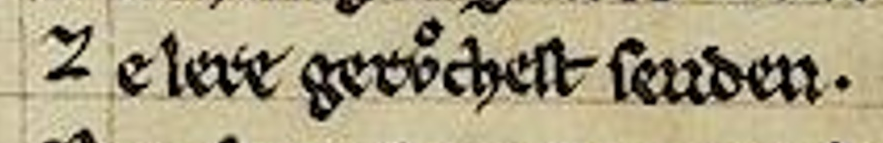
Ze lere gerv°ocheſt ſenden.
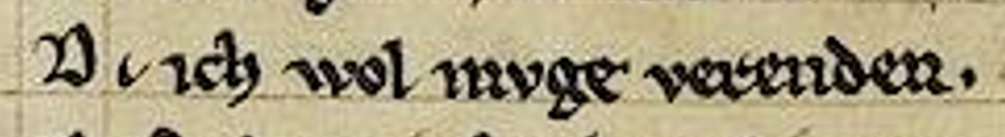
D(az) ich wol mvge verenden.
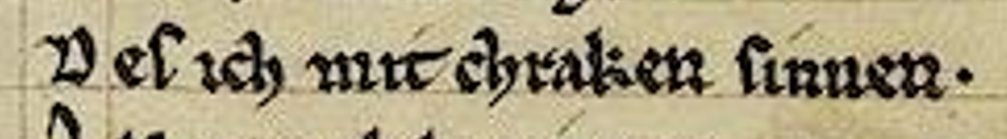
Deſ ich mit chraken ſinnen.
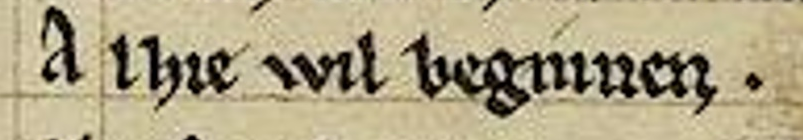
Alhie wil beginnen.
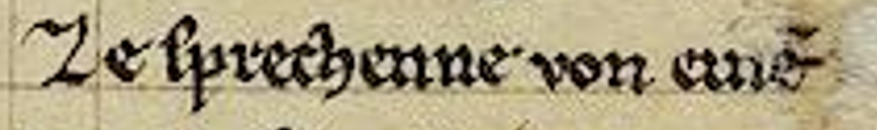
Ze ſprechene von eine(m) xxx
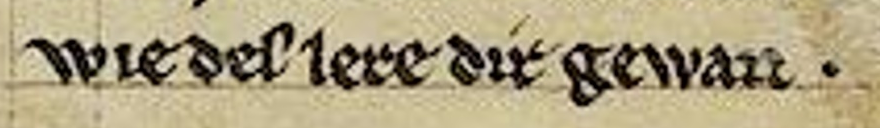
Wie deſ lere dir gewan.
